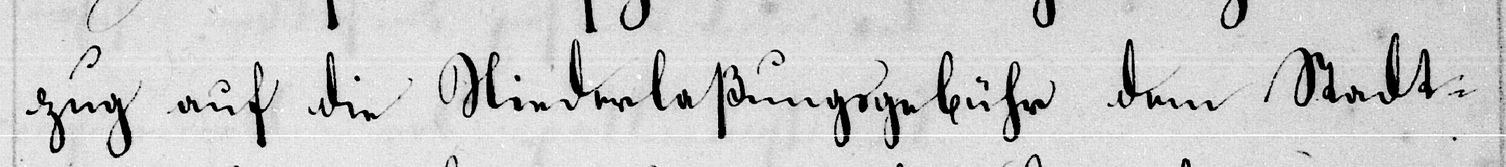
zug auf die Niederlaßungsgebühr dem Stadt¬
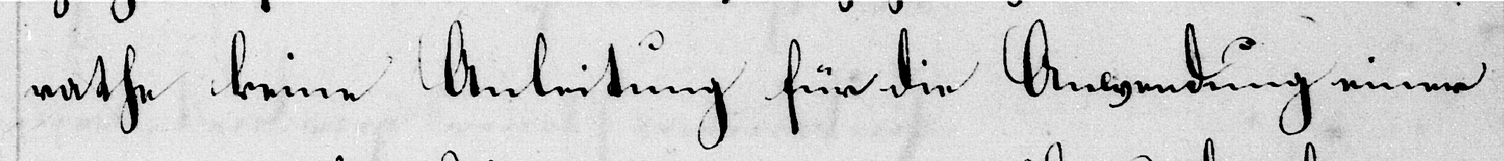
rathe keine Anleitung für die Anwendung einer
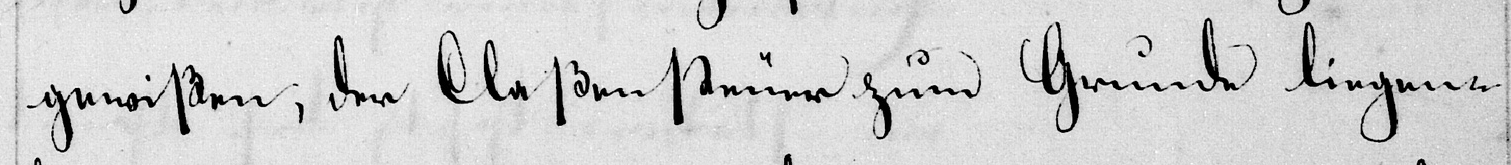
gewißen, der Claßensteuer zum Grunde liegen¬
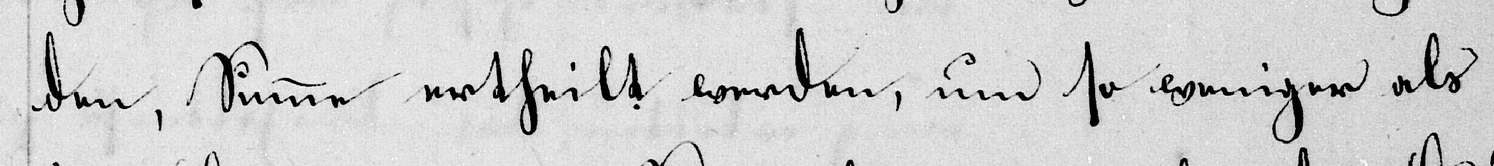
den, Summe ertheilt werden, um so weniger als
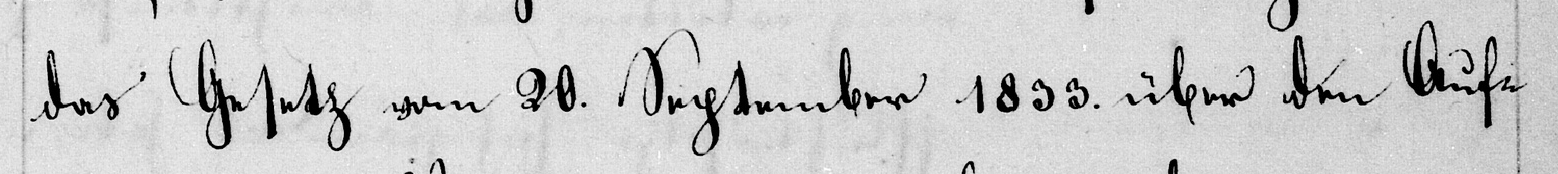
das Gesetz vom 20. September 1833. über den Auf¬
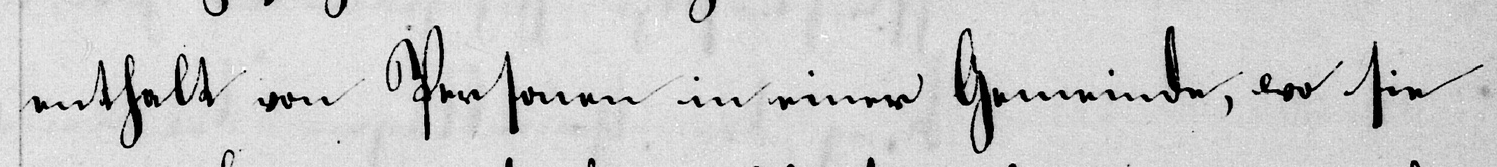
enthalt von Personen in einer Gemeinde, wo sie
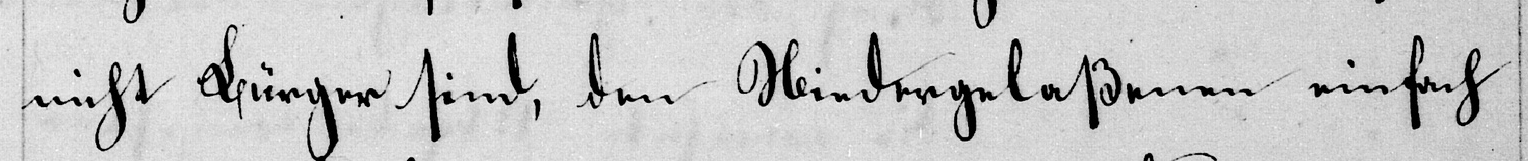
nicht Bürger sind, den Niedergelaßenen einfach
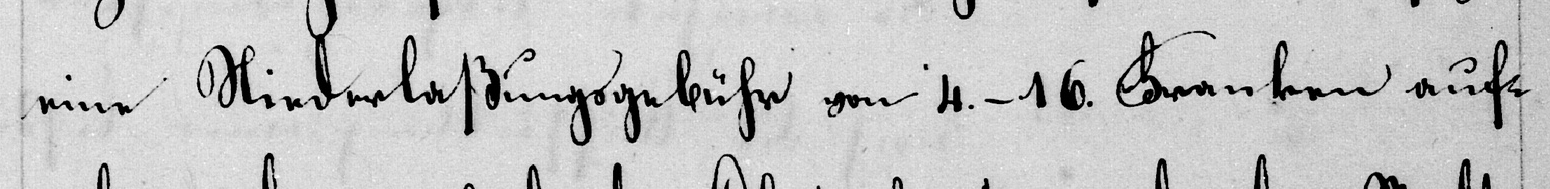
eine Niederlaßungsgebühr von 4. – 16. Franken auf¬
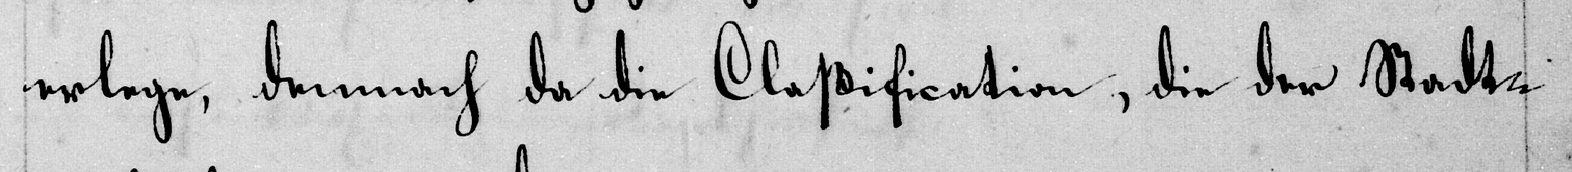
erlege, demnach da die Claßification, die der Stadt¬
